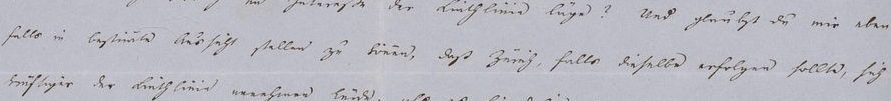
falls in bestimmte Aussicht stellen zu können, daß Zürich, falls dieselbe erfolgen sollte, sich
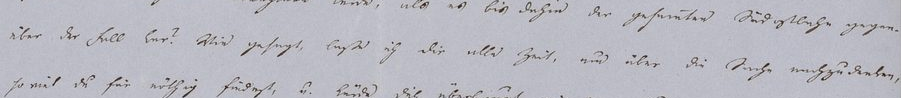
über der Fall war? Wie gesagt, laße ich Dir alle Zeit, um über die Sache nachzudenken ,
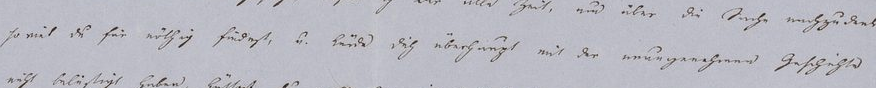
so weit Du für nöthig findest, u. würde Dich überhaupt mit der unangenehmen Geschichte
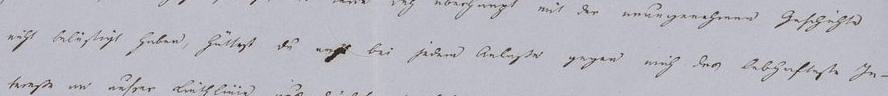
nicht belästigt haben, hättest Du nicht bei jedem Anlaße gegen mich das lebhafteste In-
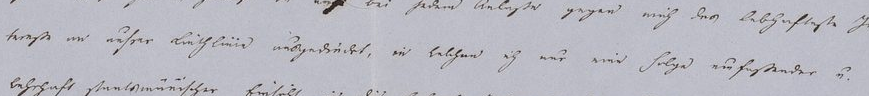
tereße an unsrer Linthlinie ausgedrückt, in welchem ich nur eine Folge umfaßender u.
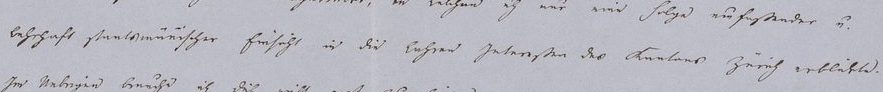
wahrhaft staatsmännischer Einsicht in die wahren Intereßen des Kantons Zürich erblickte.
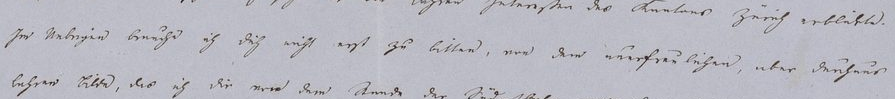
Im Uebrigen brauche ich Dich nicht erst zu bitten, von dem unerfreulichen aber durchaus
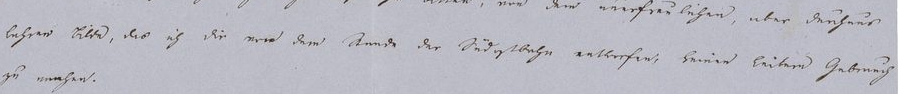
wahren Bilde, das ich Dir von dem Stande der Südostbahn entworfen keinen weitern Gebrauch
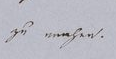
zu machen.
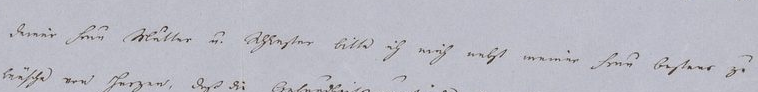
Deiner Frau Mutter u. Schwester bitte ich mich nebst meiner Frau bestens zu
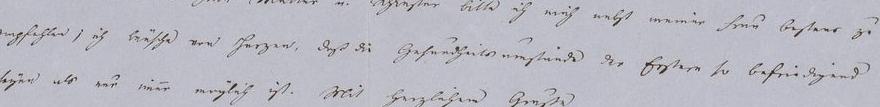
empfehlen; ich wünsche von Herzen, daß die Gesundheitsumstände der Erstern so befriedigend
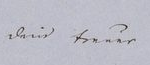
Dein treuer
